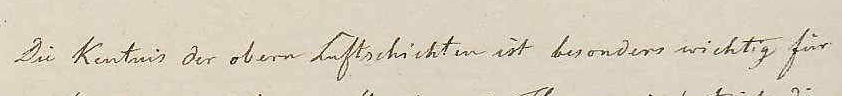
Die Kentnis der obern Luftschichten ist besonders wichtig für
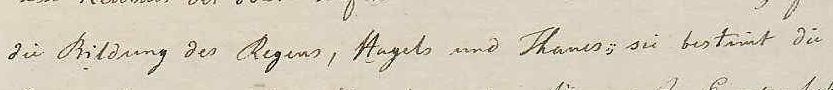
die Bildung des Regens, Hagels und Thaues; sie bestimt die
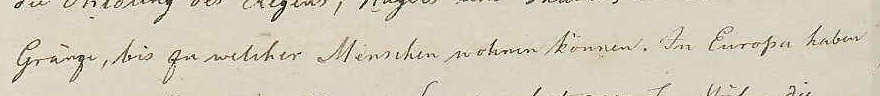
Gränze, bis zu welcher Menschen wohnen können. In Europa haben
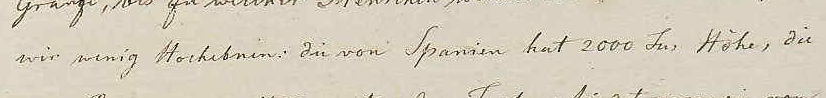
wir wenig Hochebnen: die von Spanien hat 2000 Fus Höhe, die
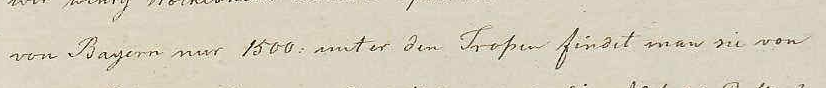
von Bayern nur 1500: unter den Tropen findet man sie von
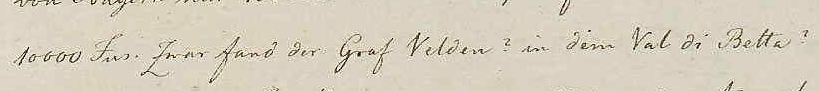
10000 Fus. Zwar fand der Graf Velden ? in dem Val di Belta ?
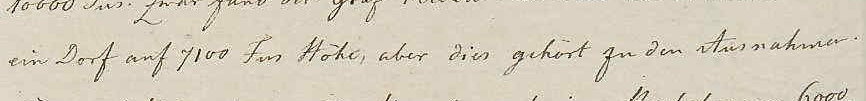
ein Dorf auf 7100 Fus Höhe, aber dies gehört zu den Ausnahmen.
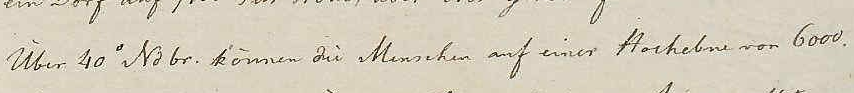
Über 40° Ndbr. können die Menschen auf einer Hochebne von 6000
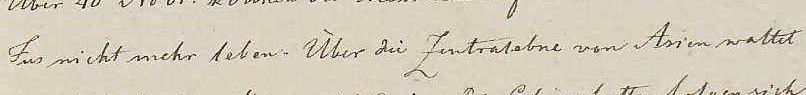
Fus nicht mehr leben. Über die Zentralebne von Asien waltet
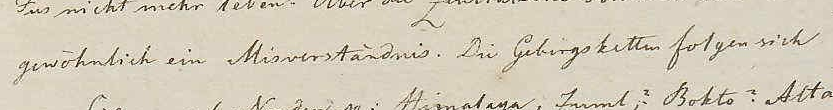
gewöhnlich ein Misverständnis. Die Gebirgsketten folgen sich
